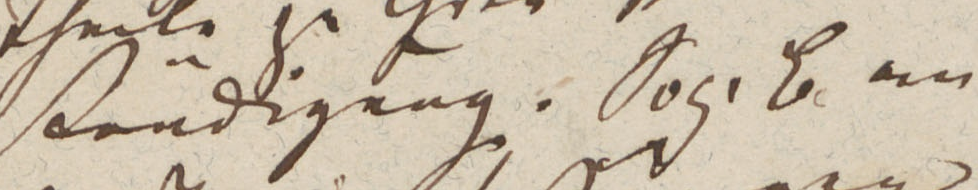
ständigung. So z. B an
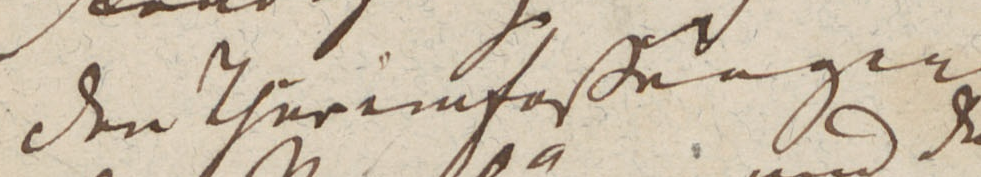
den Thüreinfassungen
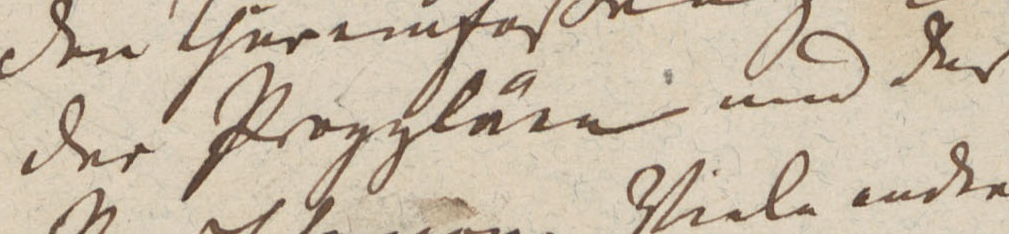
der Propyläen und des
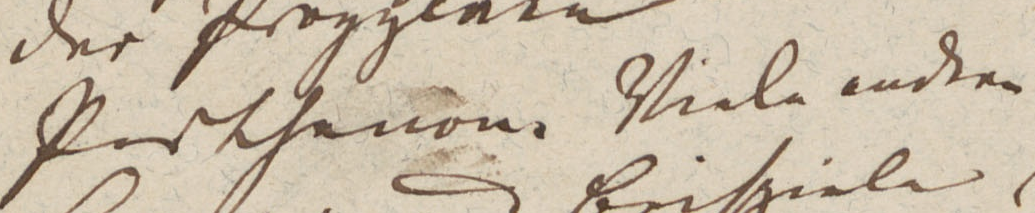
Parthenon. Viele andere
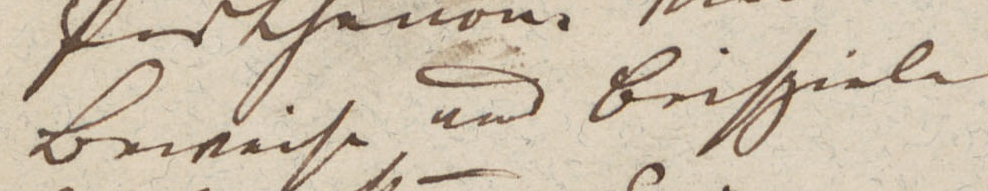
Beweise und Beispiele
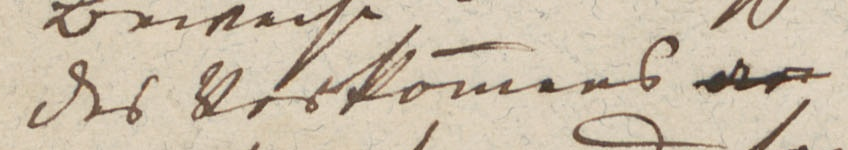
des Vorkommens ar
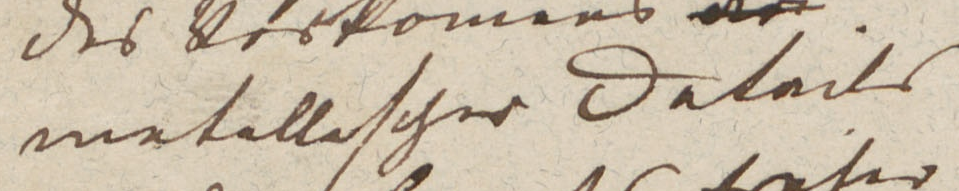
metallischer Details
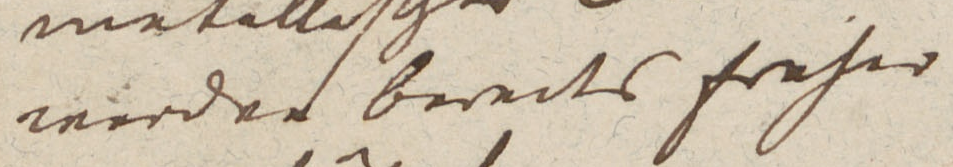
wurden bereits früher
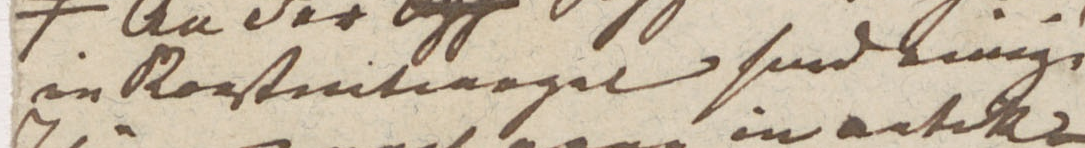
in Konstantinopel sind einige
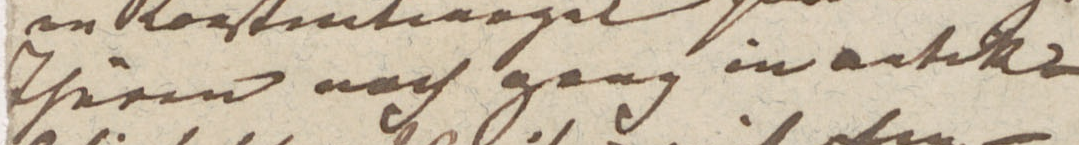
Thüren noch ganz in antik-
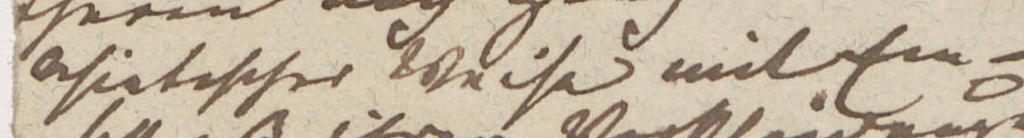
asiatischer Weise mit Ein-
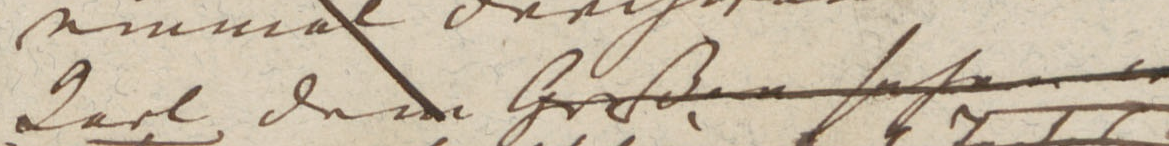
Karl dem Grossen sehen wir die
